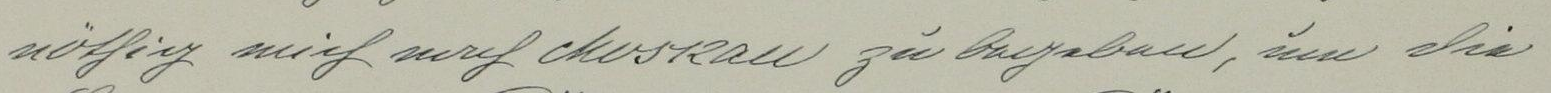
nöthig mich nach Moskau zu begeben, um die
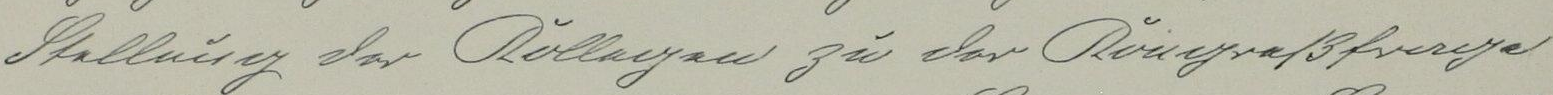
Stellung der Kollegen zu der Kongreßfrage
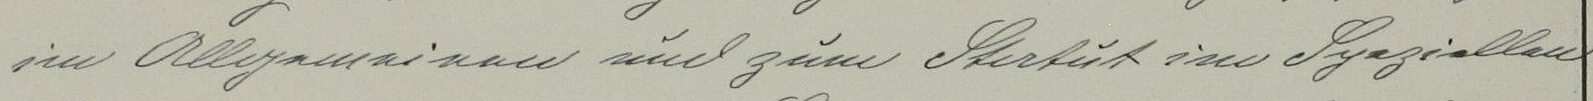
im Allgemeinen und zum Statut im Speziellen
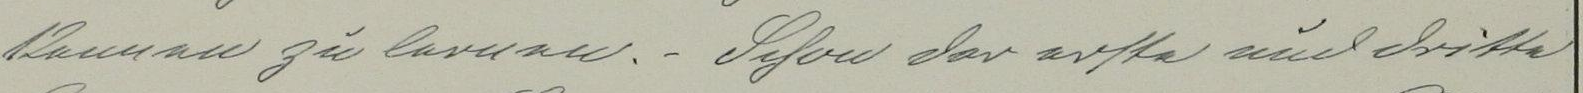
kennen zu lernen. - Schon der erste und dritte
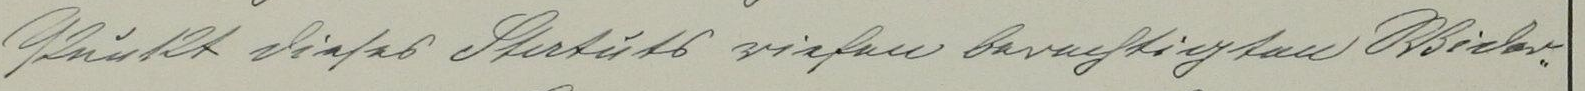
Punkt dieses Statuts riefen berechtigten Wider-
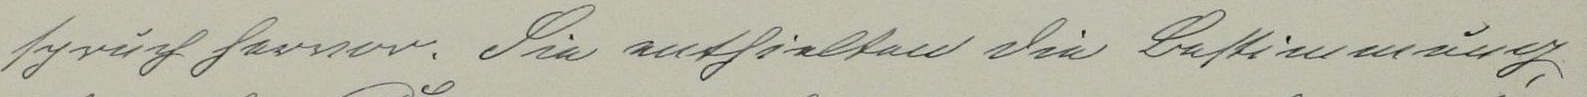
spruch hervor. Sie enthielten die Bestimmung,
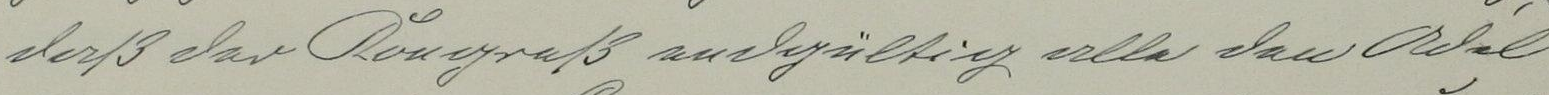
daß der Kongreß endgültig alle den Adel
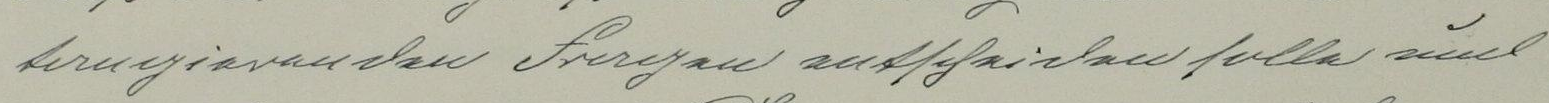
tangierenden Fragen entscheiden solle und
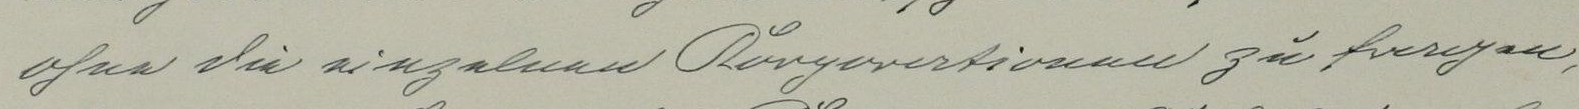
ohne die einzelnen Korporationen zu fragen,
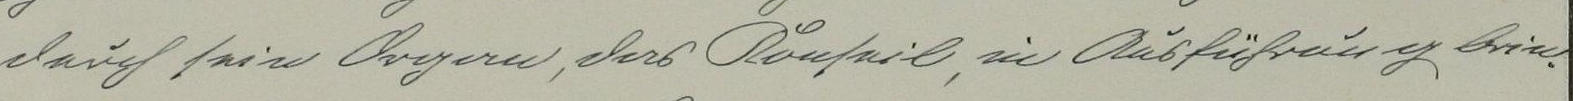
durch sein Organ, das Konseil, in Ausführung brin-
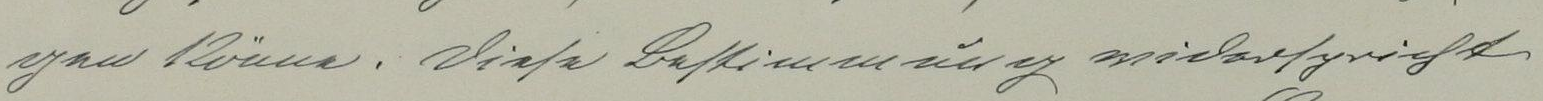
gen könne. Diese Bestimmung widerspricht
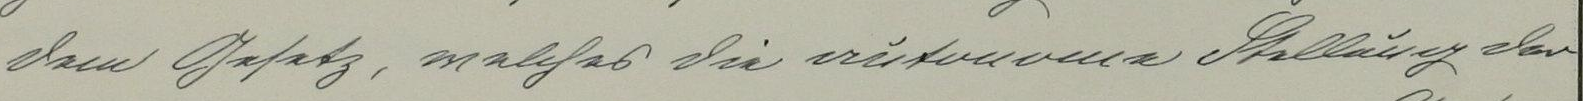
dem Gesetz, welches die autonome Stellung der
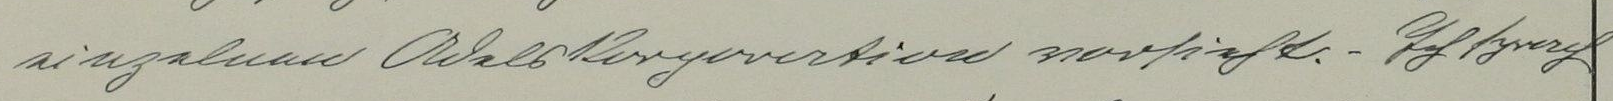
einzelnen Adelskorporationen vorsieht. - Ich sprach
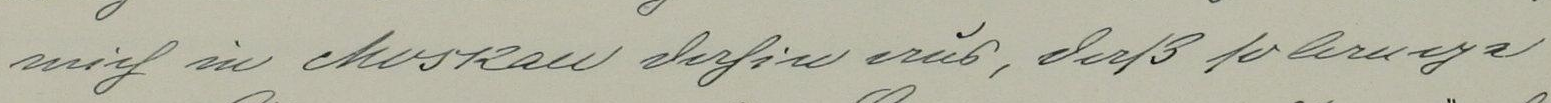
mich in Moskau dahin aus, daß so lange
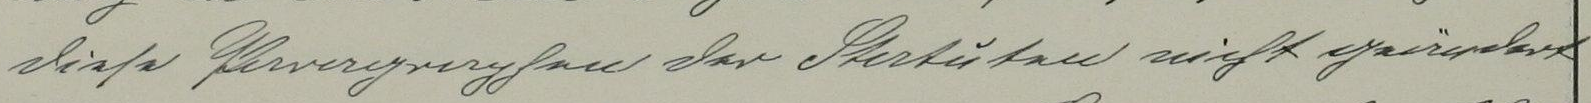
diese Paragraphen der Statuten nicht geändert
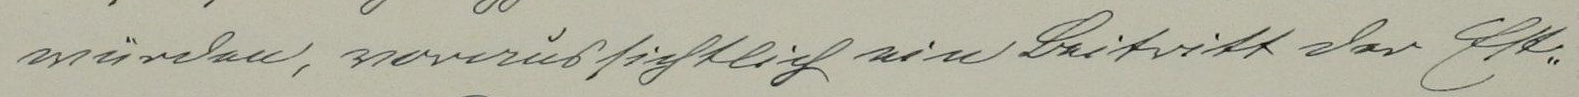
würden, voraussichtlich ein Beitritt der Est-
